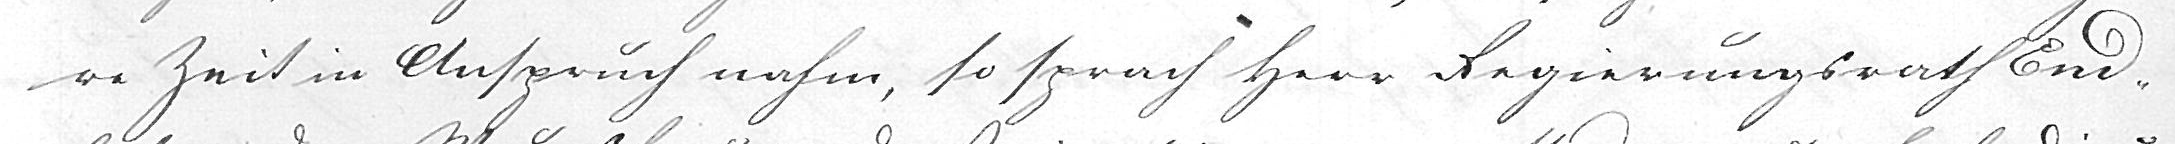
re Zeit in Anspruch nahm, so sprach Herr Regierungsrath End-
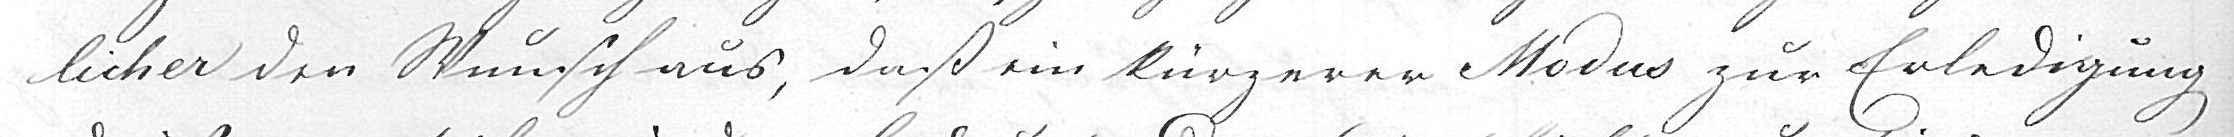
licher den Wunsch aus, daß ein kürzerer Modus zur Erledigung
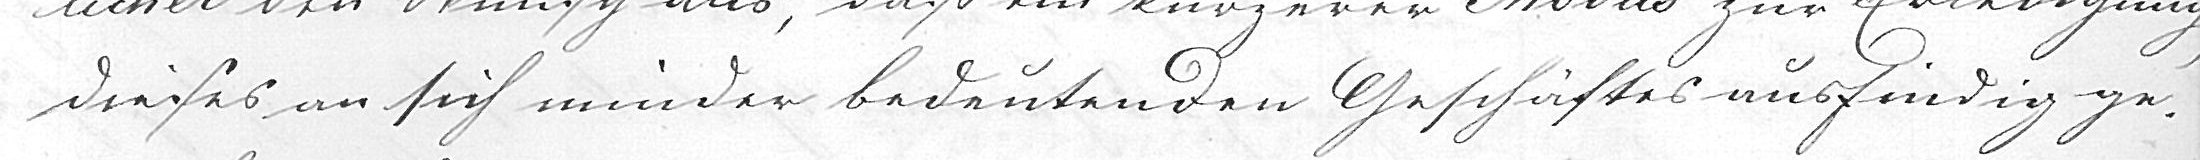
dieses an sich minder bedeutenden Geschäftes ausfindig ge-
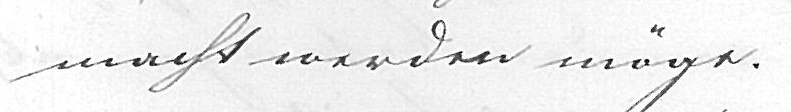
macht werden möge.
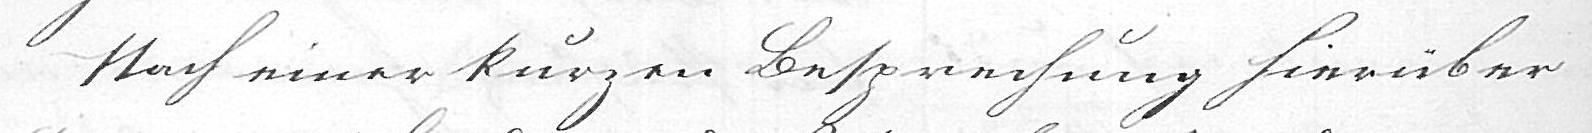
Nach einer kurzen Besprechung hierüber
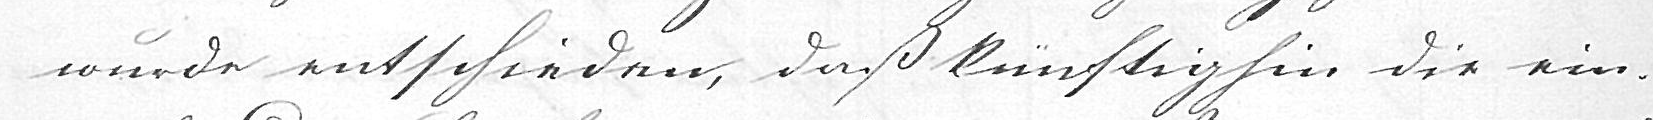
wurde entschieden, daß künftighin die ein-
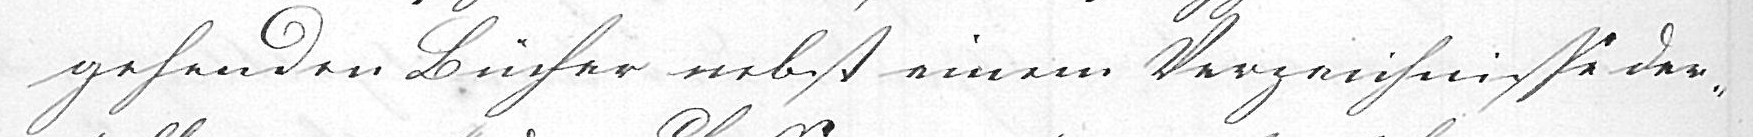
gehenden Bücher nebst einem Verzeichnisse der-
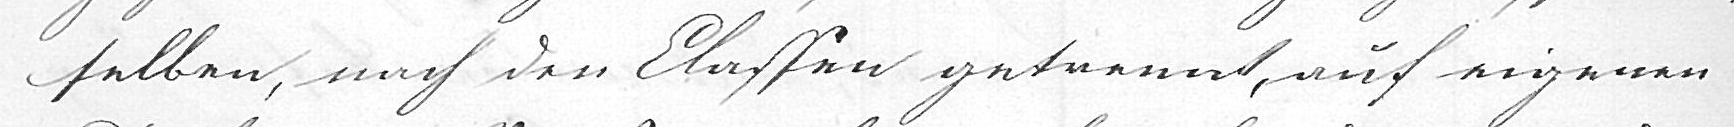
selben, nach den Classen getrennt, auf eigenen
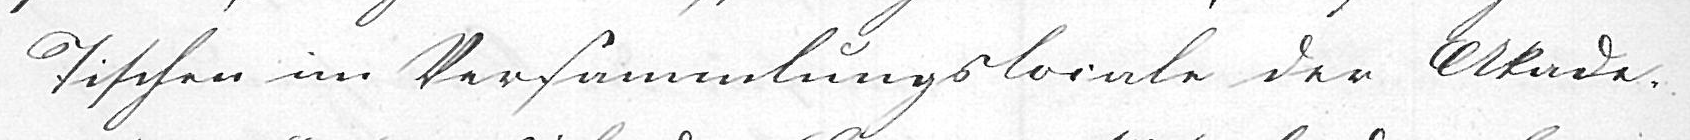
Tischer im Versammlungslocale der Akade-
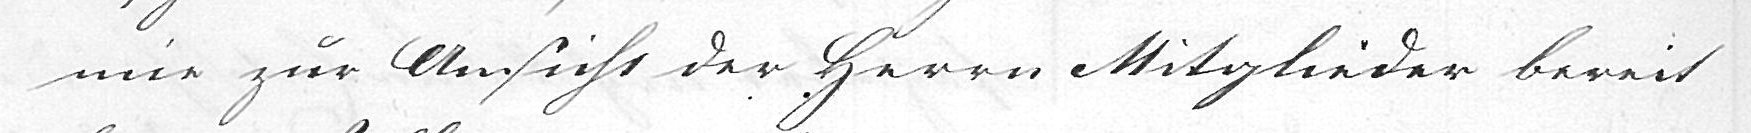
mie zur Ansicht der Herrn Mitglieder bereit
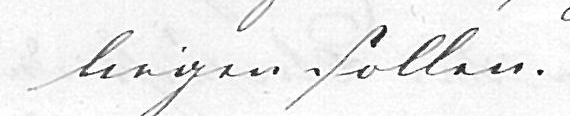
liegen sollen.
